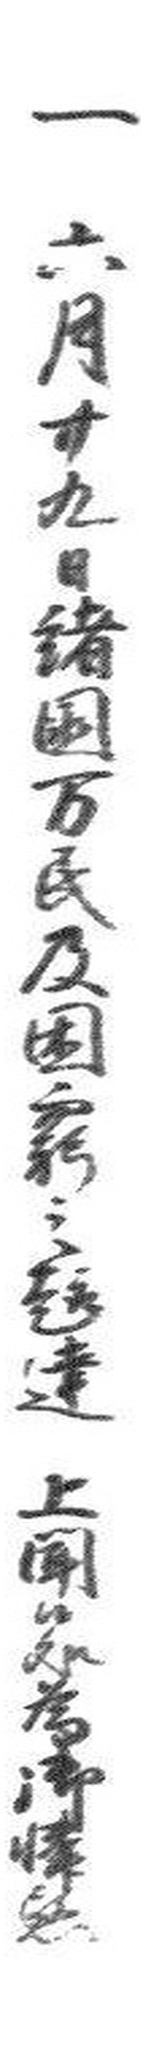一六月廿九日諸国万民及困窮之趣達上聞候処為御憐愍
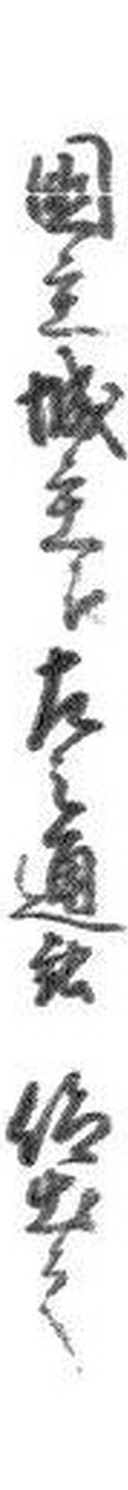国主城主江左之通被仰出之
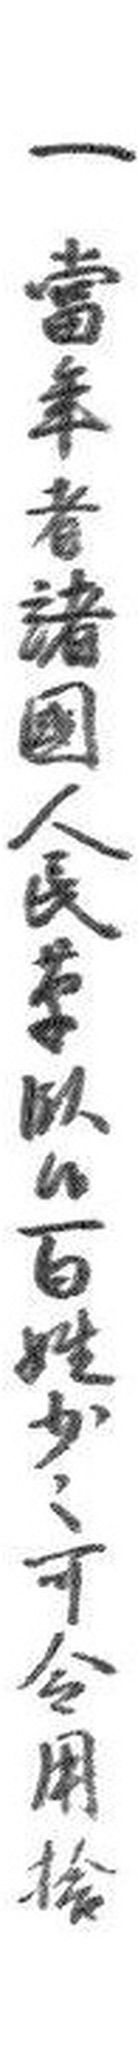一当年者諸国人民草臥候百姓少々可令用捨

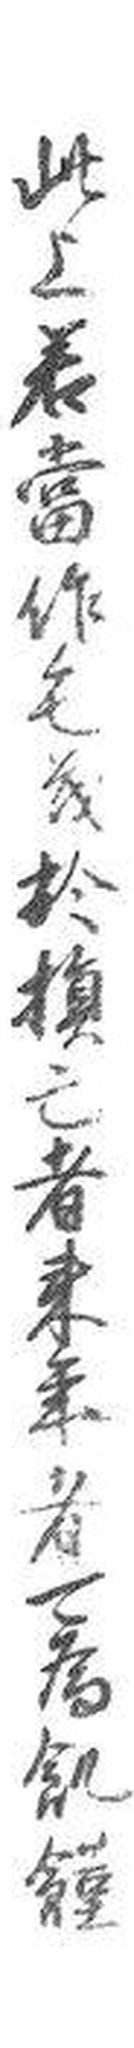此上若当作毛も於損亡者来年者可為飢饉
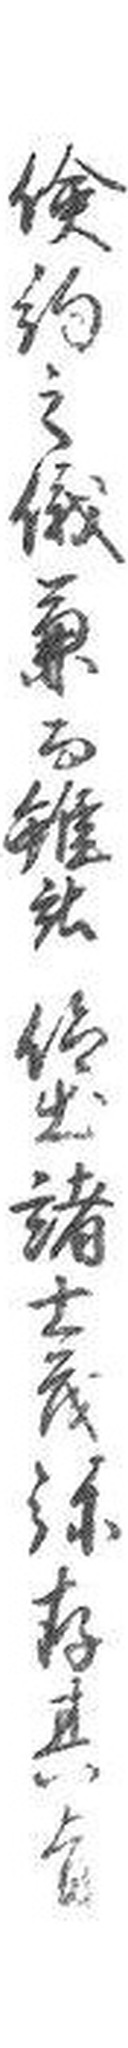倹約之儀兼而雖被仰出諸士も弥存其旨
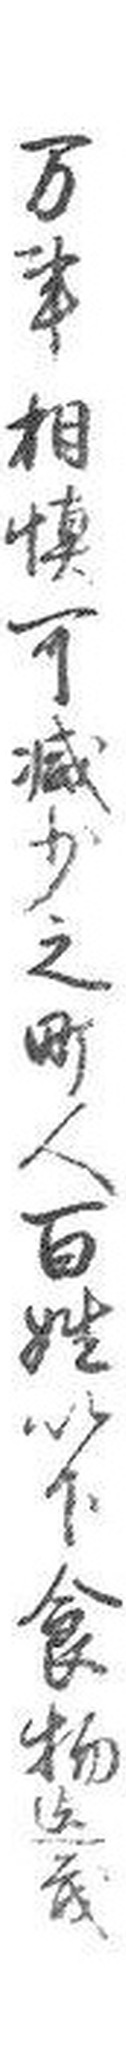万事相慎可減少之町人百姓以下食物迄も
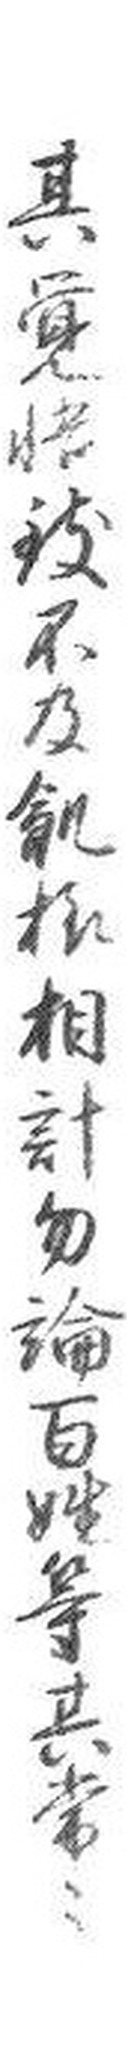其覚悟致不及飢様相計勿論百姓等共常々
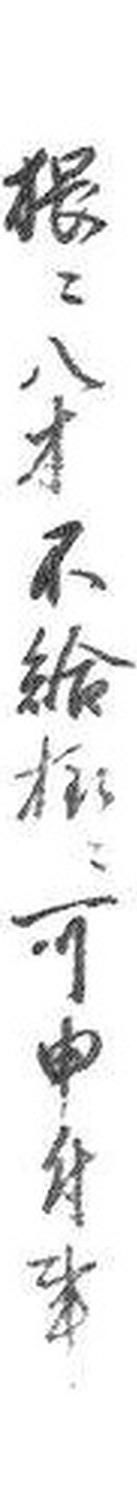猥ニ八木不給様ニ可申付事
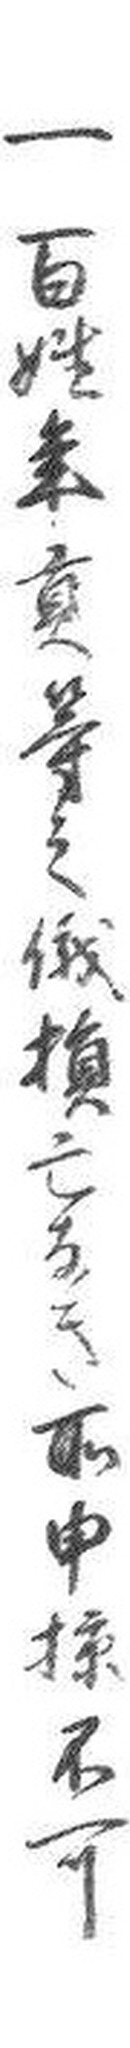一百姓年貢等之儀損亡なき所申掠不可
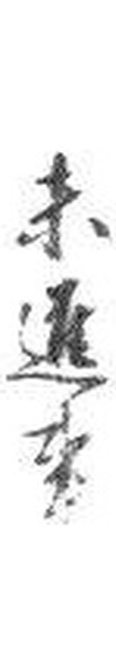未進事
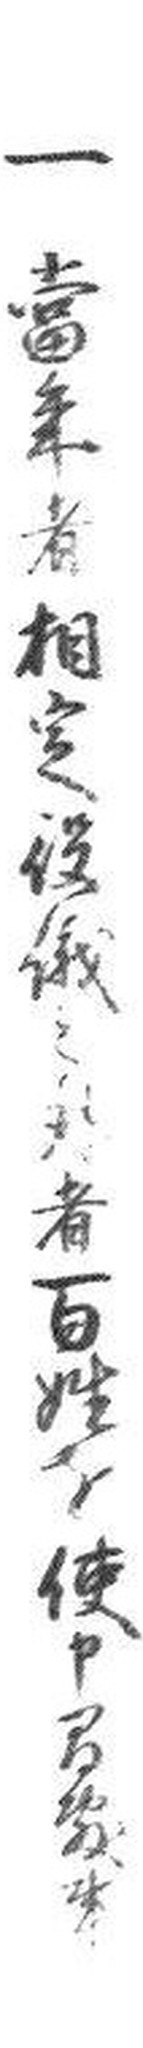一当年者相定役儀之外者百姓を使申間敷事
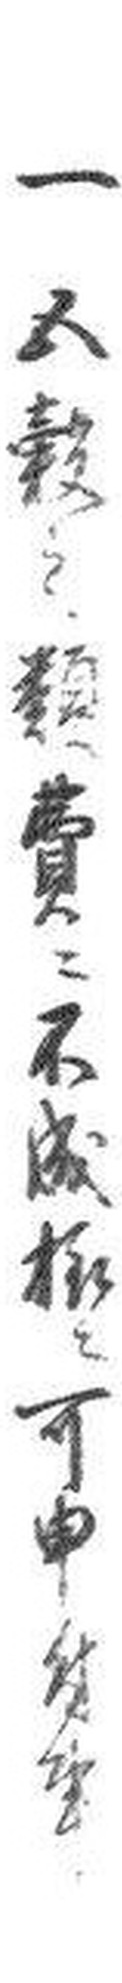一五穀之類費ニ不成様ニ可申付事
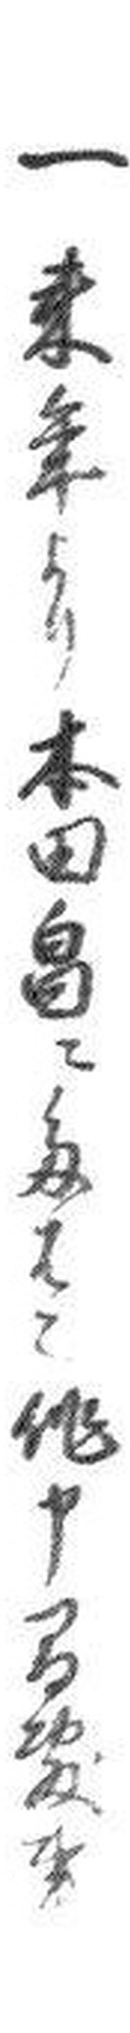一来年より本田畠ニたばこ作申間敷事
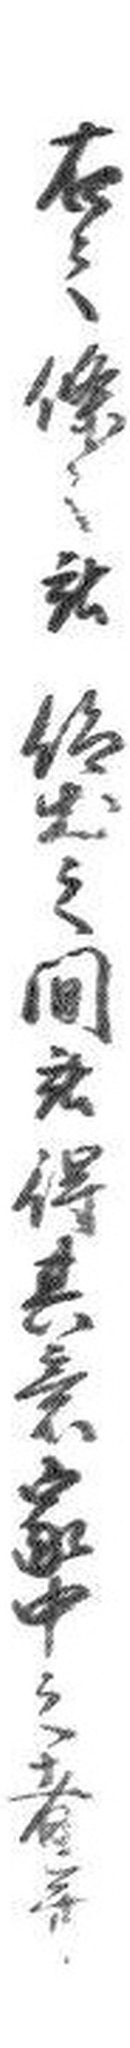右之条々被仰出之間被得其意家中之者并
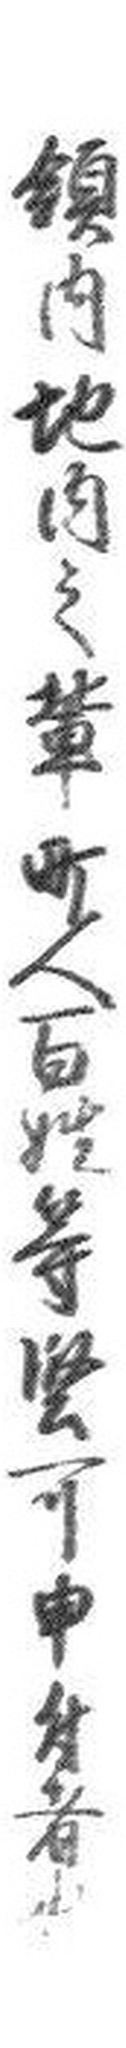領内地内之輩町人百姓等堅可申付者也
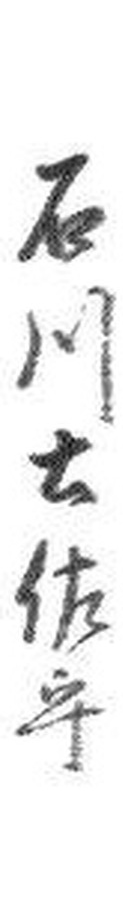石川土佐守
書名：家譜 四 忠昌公 従寛永七年到正保四年
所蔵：福井県文書館 Fukui Prefectural Archives
